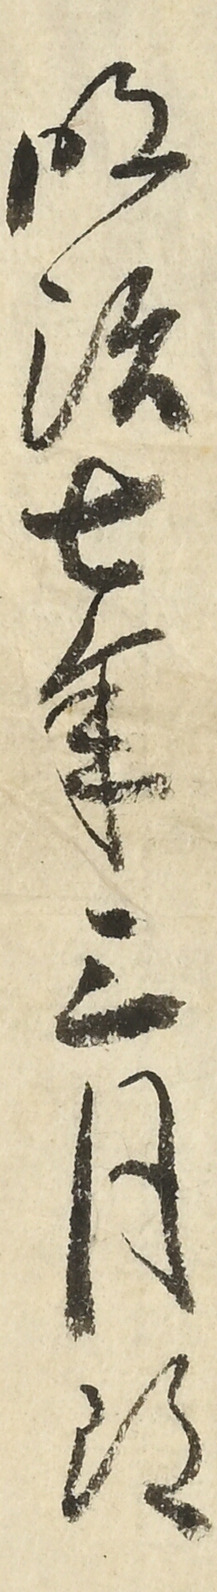明治七年三月改
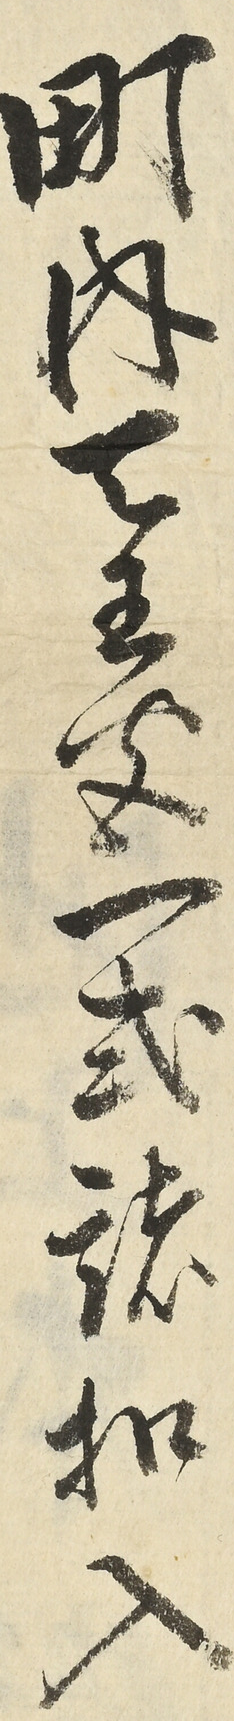町内天王宮一式諸扣入

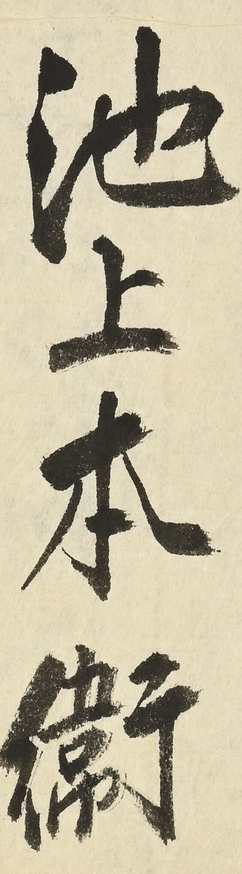池上本衛

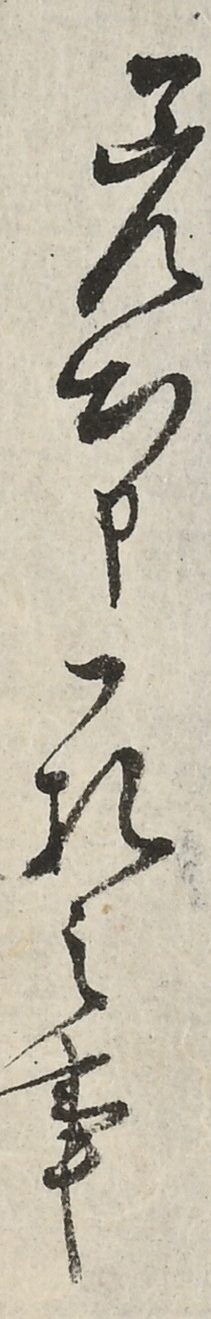差出申一札之事
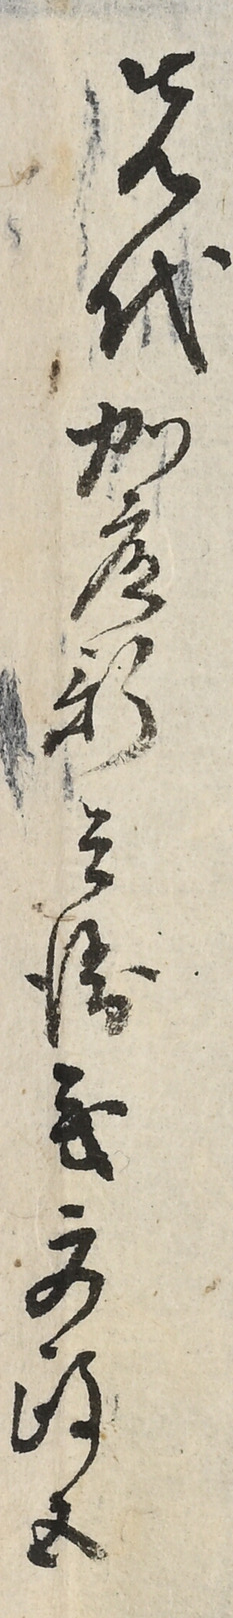先代加藤新兵衛義文政五
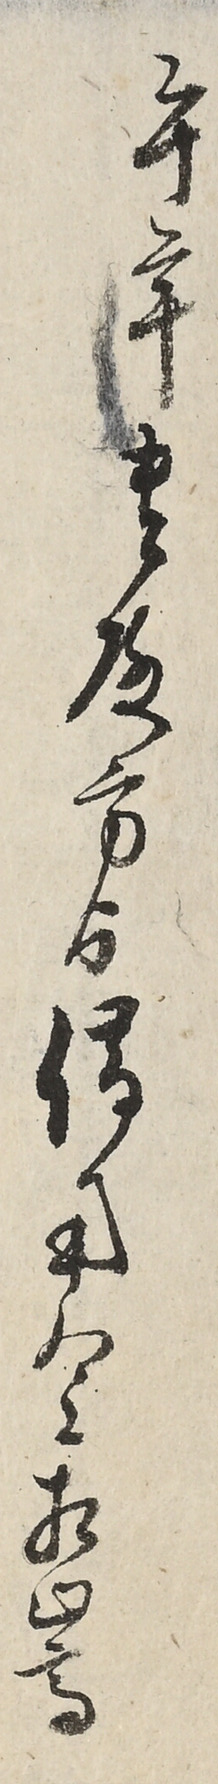午年貴殿方ゟ借用金相嵩
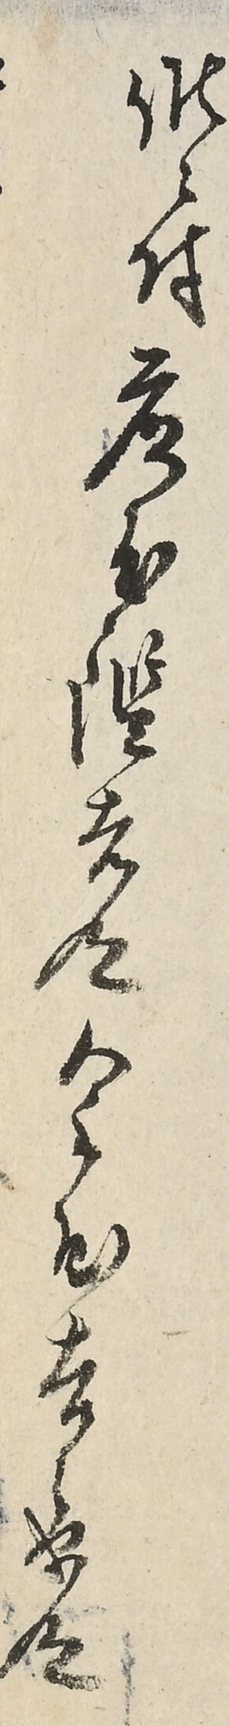候ニ付藤屋鑑吉殿金屋吉兵衛殿
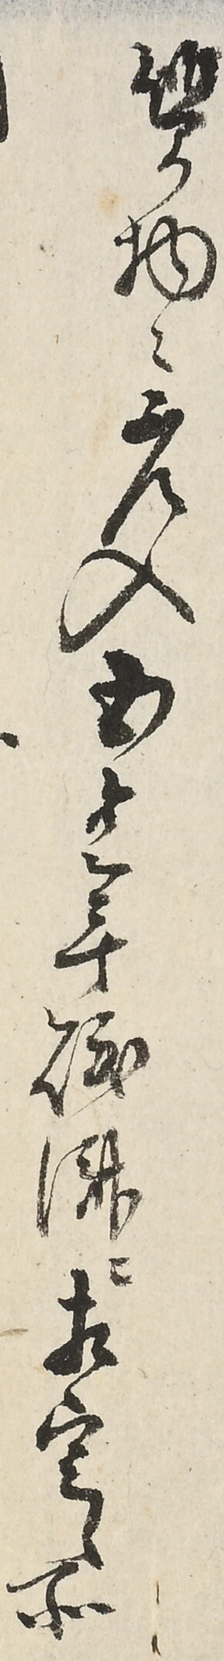質物ニ差入五ケ年賦済ニ相定候所
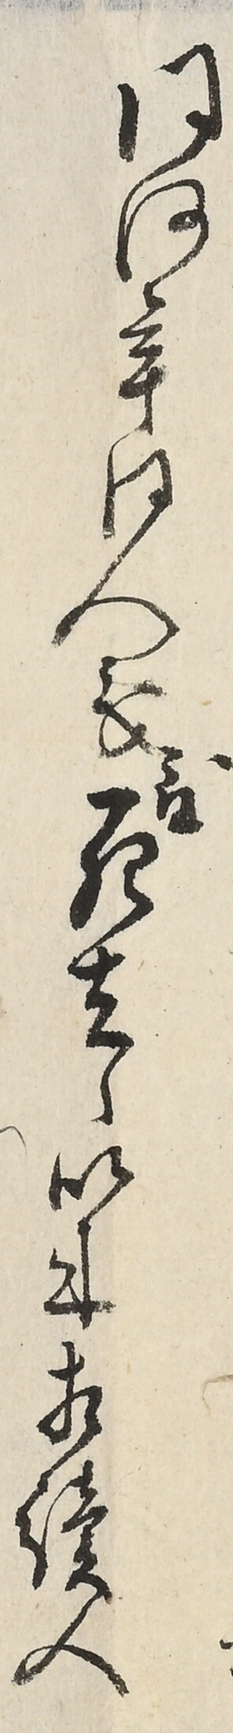同何年同人義致死去候以来相続人
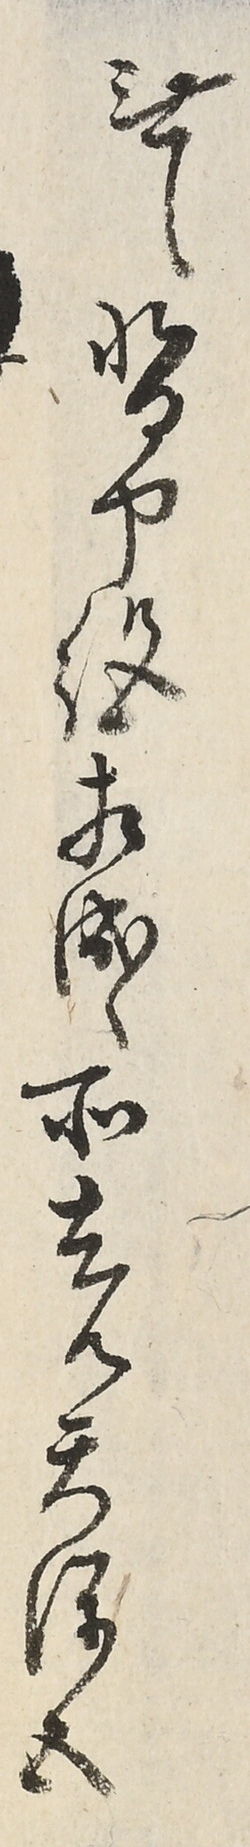無之暫中役相成候所去ル天保五
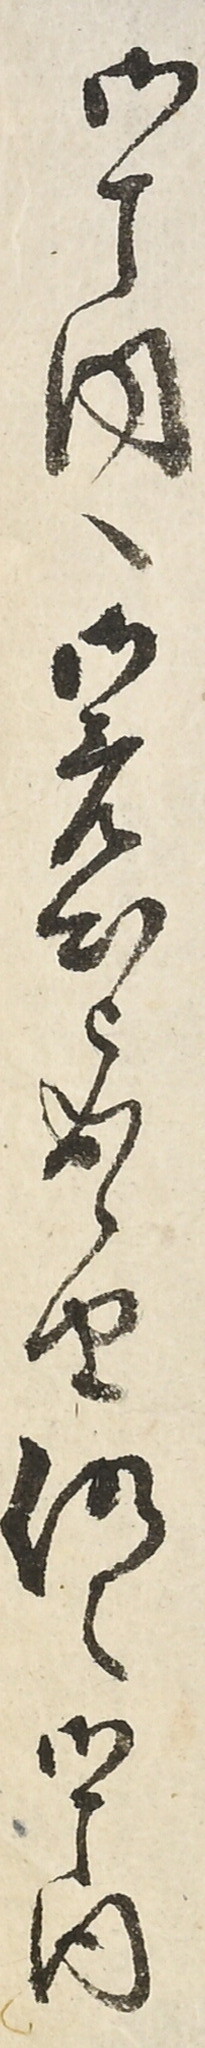御丁内へ御差出被成候由仍之御丁内
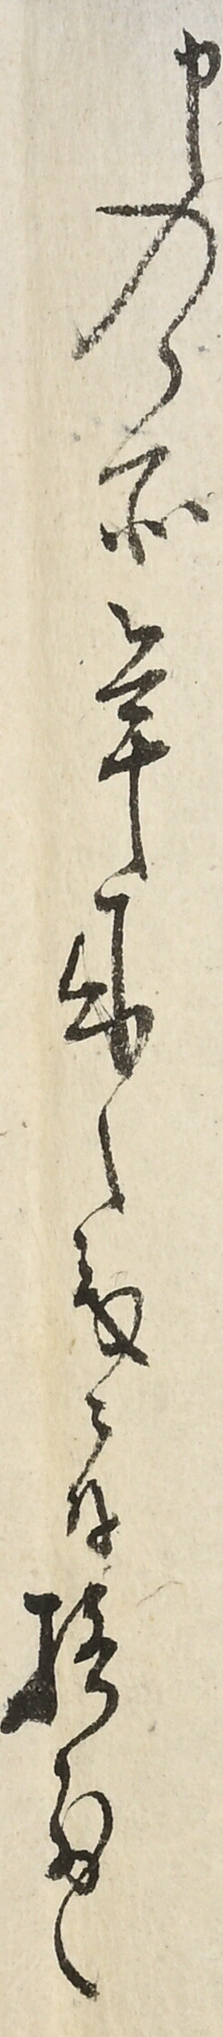申入候所年来之義ニ付格別之
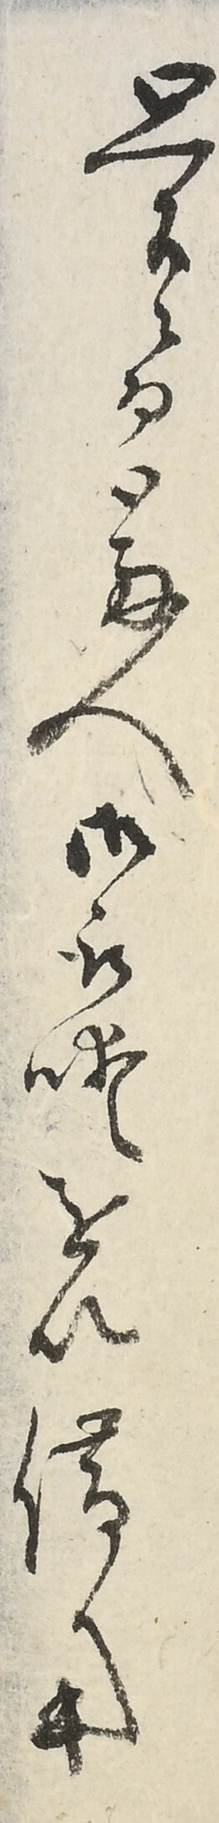思召ニ而御両人御取咄を以借用
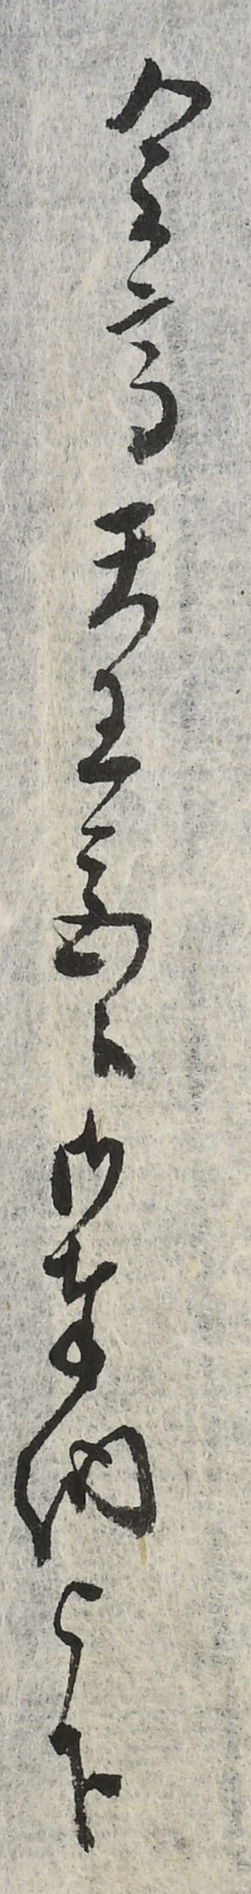金高天王宮江御奉納被下
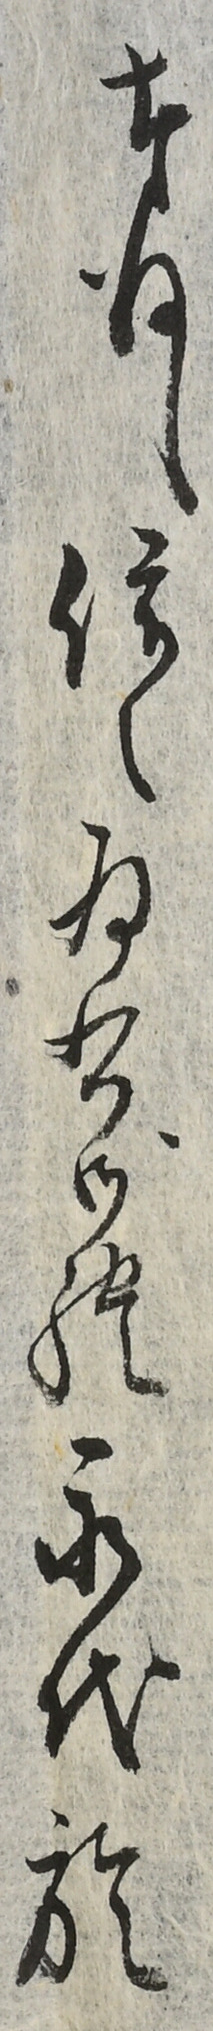奉存候依之為右御証永代於

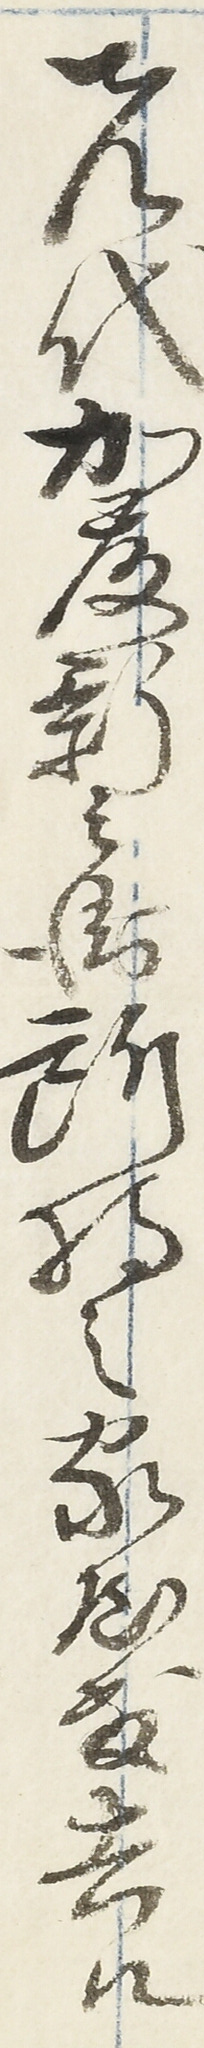先代加藤新兵衛所持之家屋敷去ル
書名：差出申一札之事
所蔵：伊那市立高遠町図書館・合同会社AMANE
